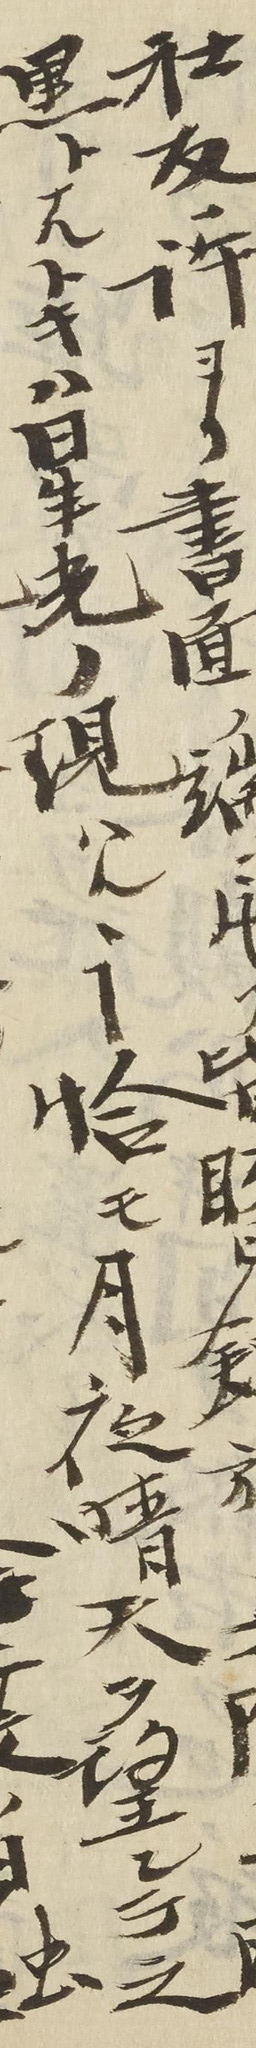黒トナルトキハ星光ノ現ハルゝコト恰モ月夜晴天ヲ望シテ之
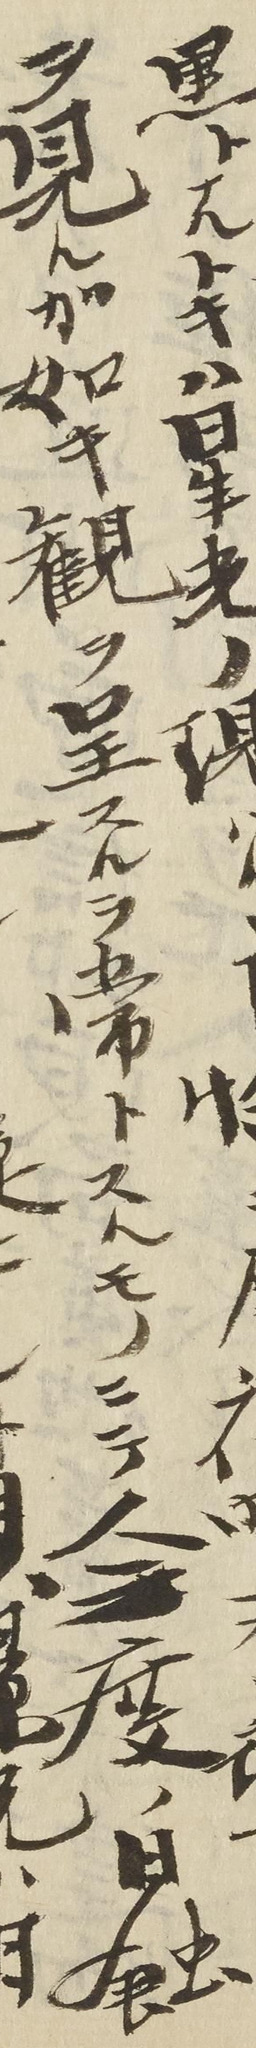ヲ見ルガ如キ観ヲ呈スルヲ常トスルモノニテ今度ノ日蝕
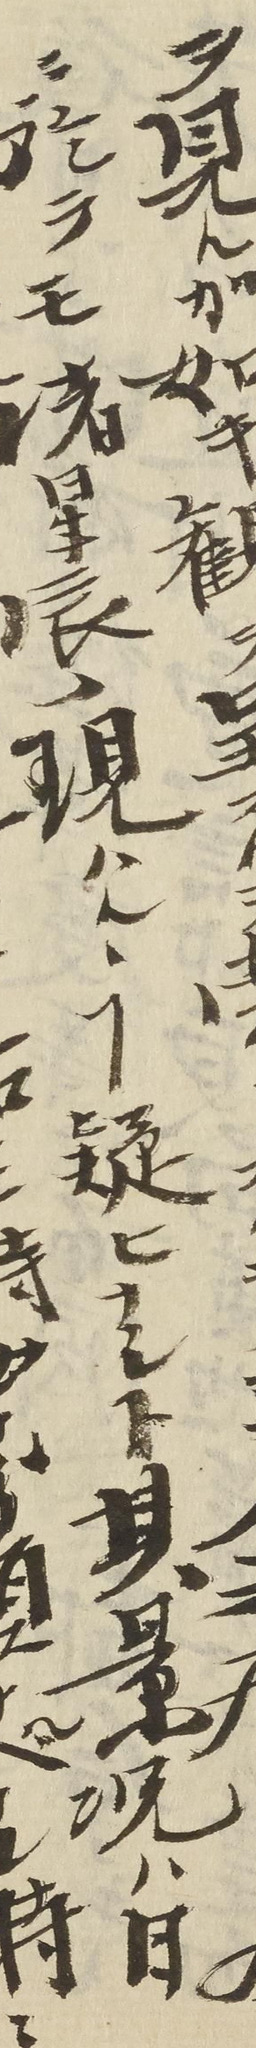ニ於テモ諸星辰ノ現ハルゝコト疑ヒナシト其景況ハ日
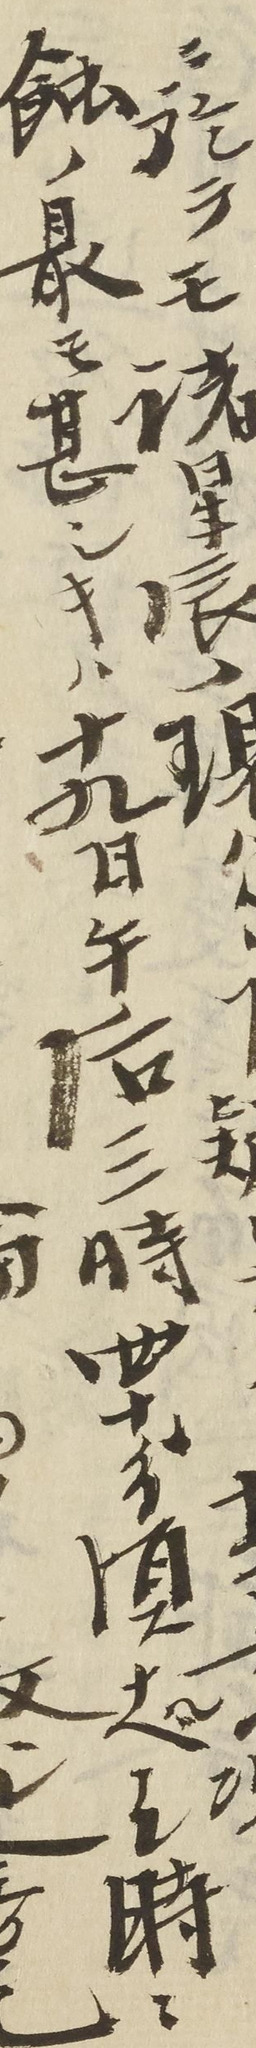蝕ノ最モ甚シキハ十九日午后三時四十分ナルベシ時ニ
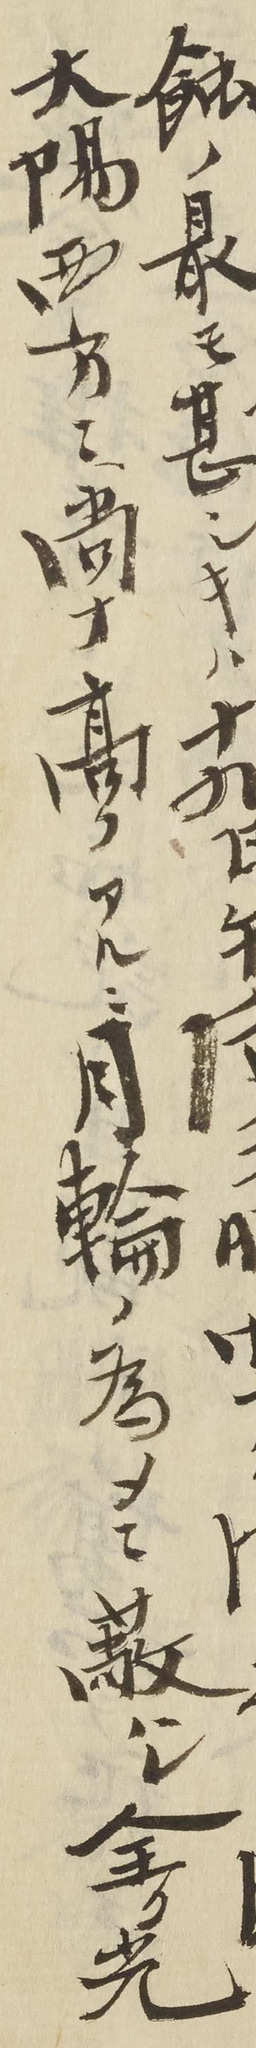大陽西方ニ尚オ高クアルニ月輪ノ為メニ蔽ハレ全ク光
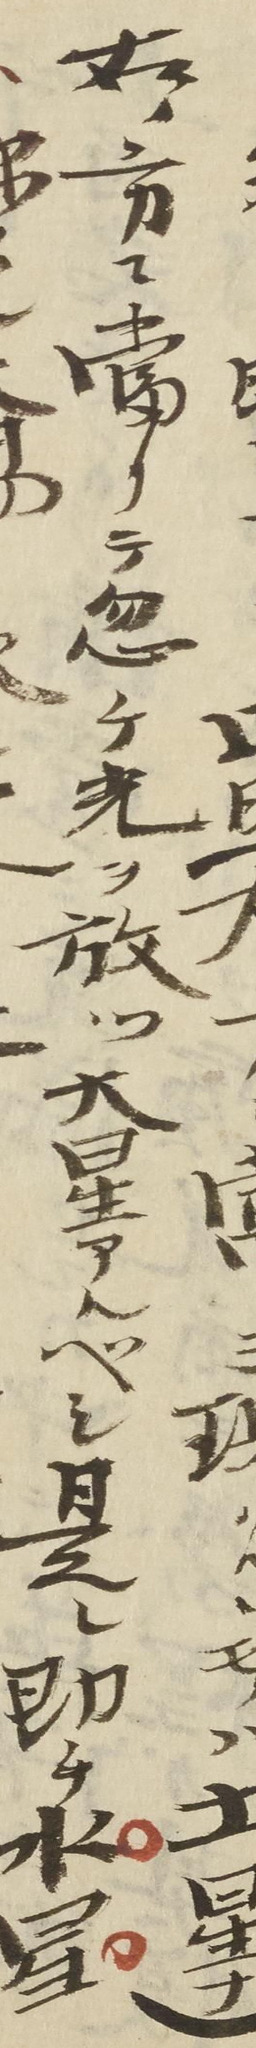右ノ方ニ当リテ忽チ光ヲ放ツ大星アルベシ是レ即チ水星
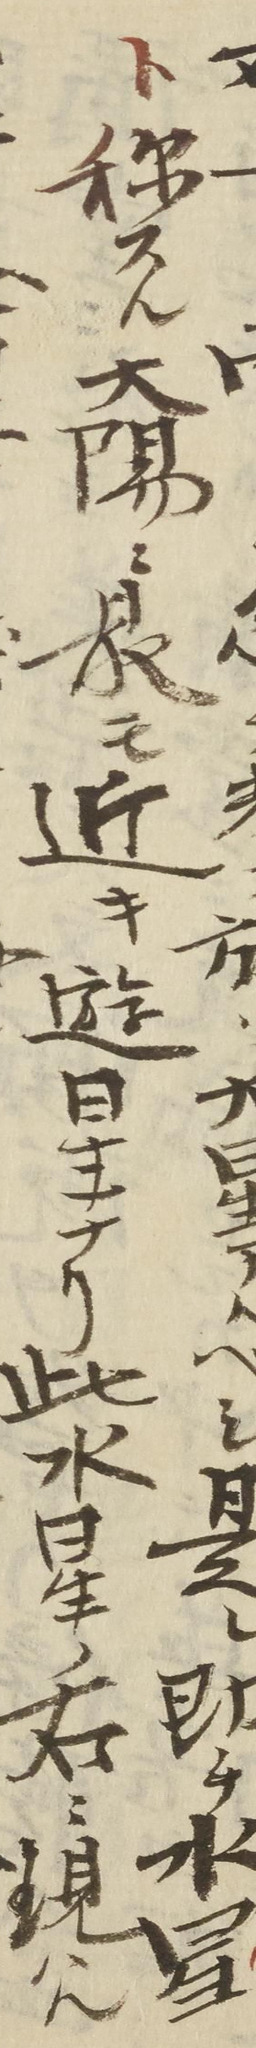ト称スル大陽ニ最モ近キ遊星ナリ此水星ノ右ニ現ハル
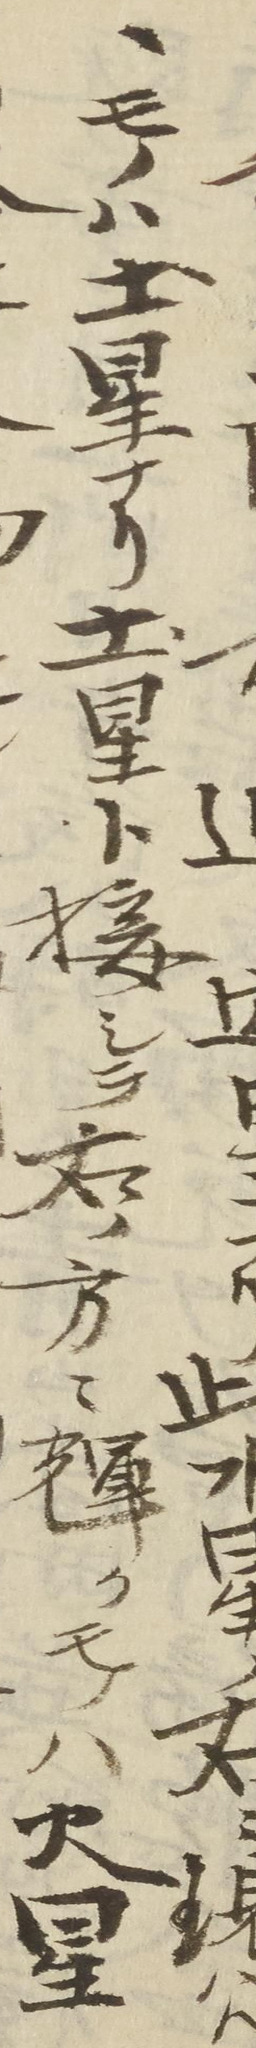ゝモノハ土星ナリ土星ト接シテ右ノ方ニ輝クモノハ火星
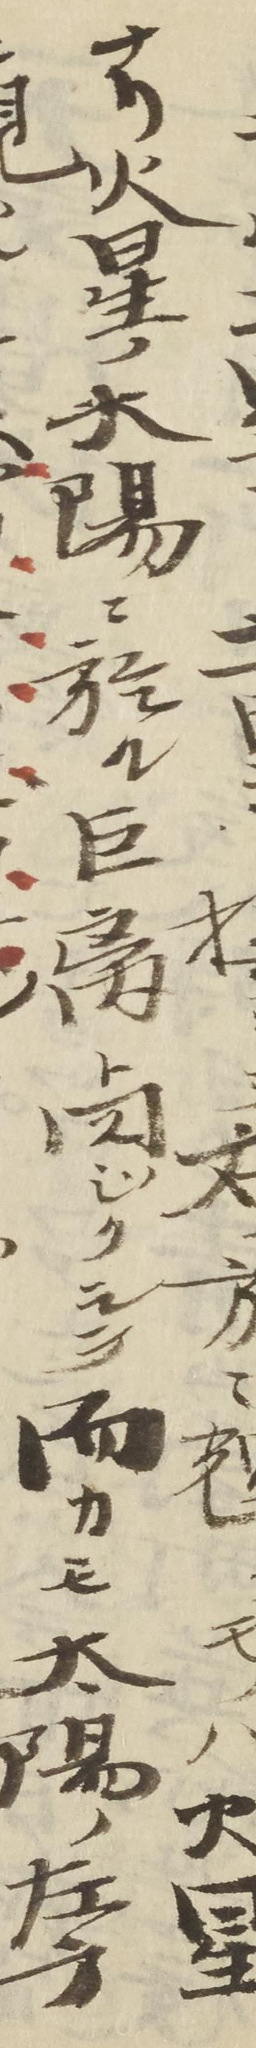ナリ火星ノ大陽ニ於ル距離ト同ジクシテ而カモ太陽ノ左方
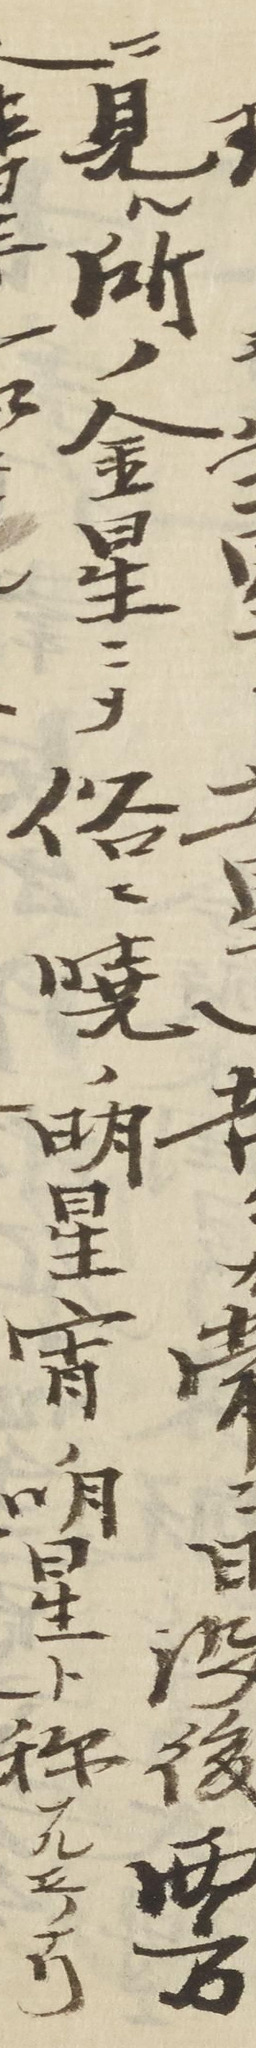ニ見ル所ノ金星ニシテ俗ニ暁ノ明星宵ノ明星ト称サルモノナリ
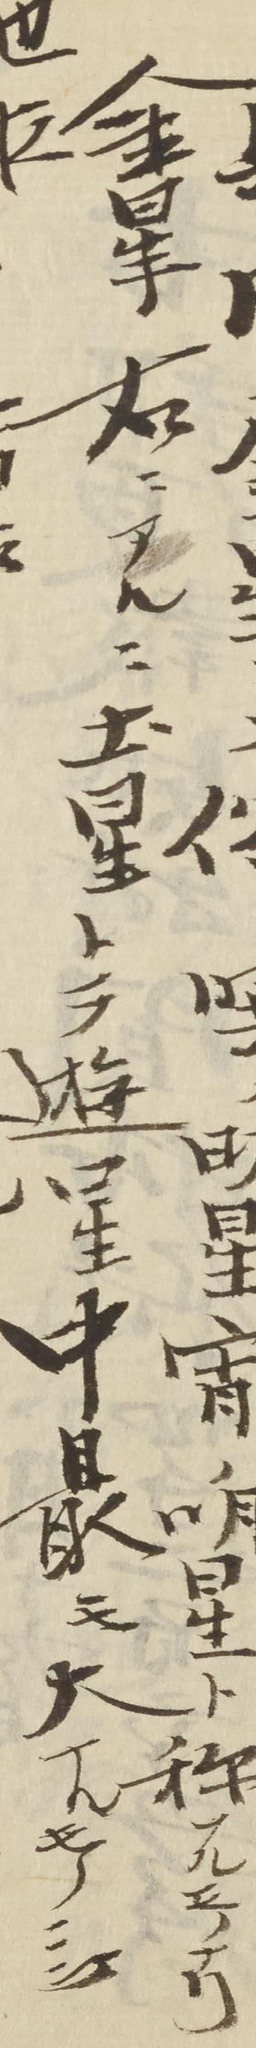金星ノ右ニアルニ土星トテ遊星中最モ大ナルモノニテ
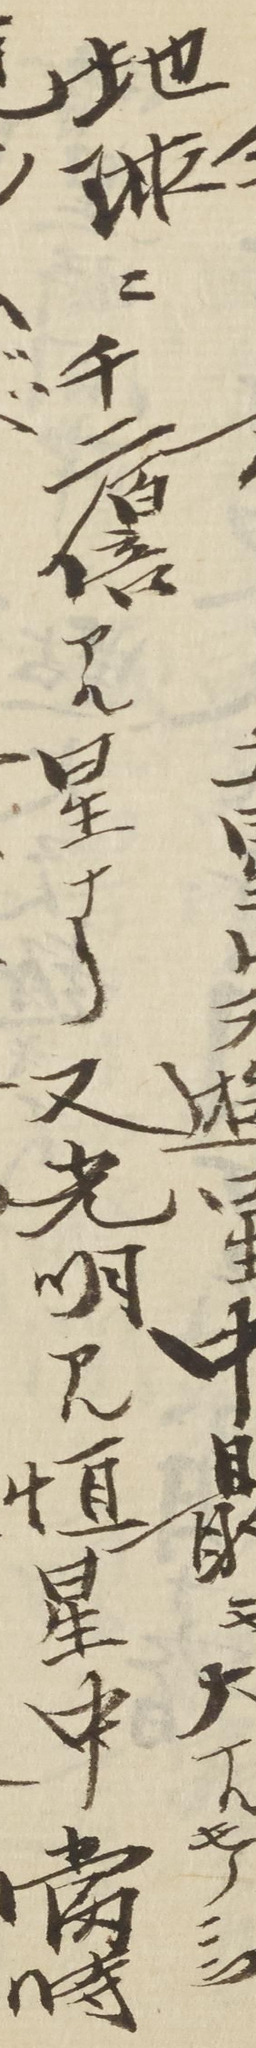地球ニ千二百倍アル星ナリ又光明アル恒星中当時
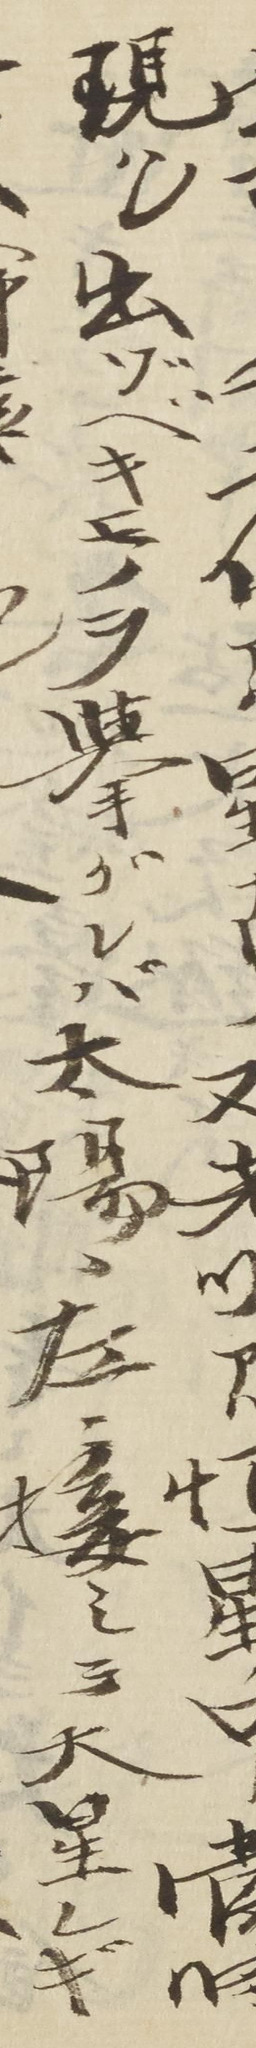現ハレ出ヅベキモノヲ挙グレバ太陽ノ左ニ接シテ大星レギ

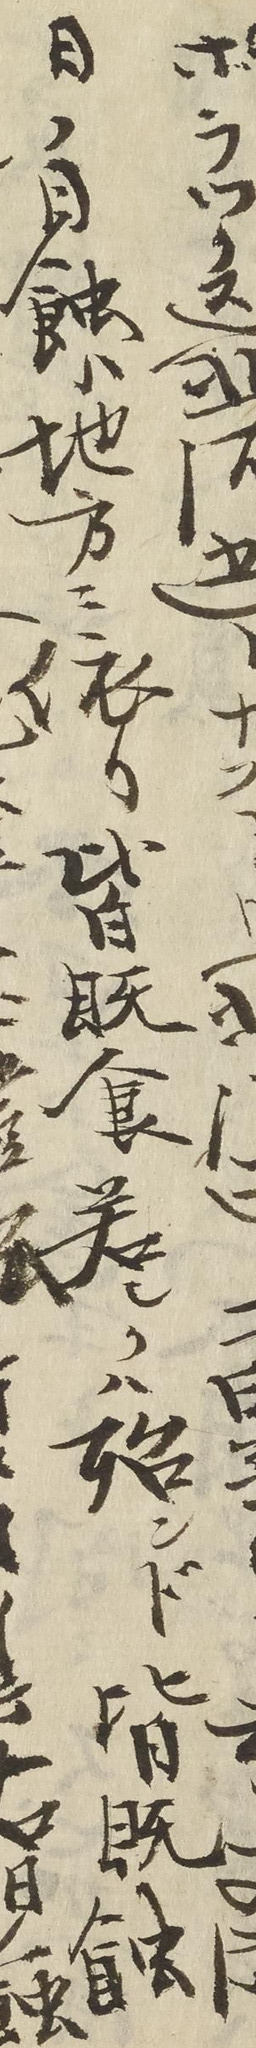日ノ日蝕ハ地方ニ依リ皆既食若シクハ殆ンド皆既蝕
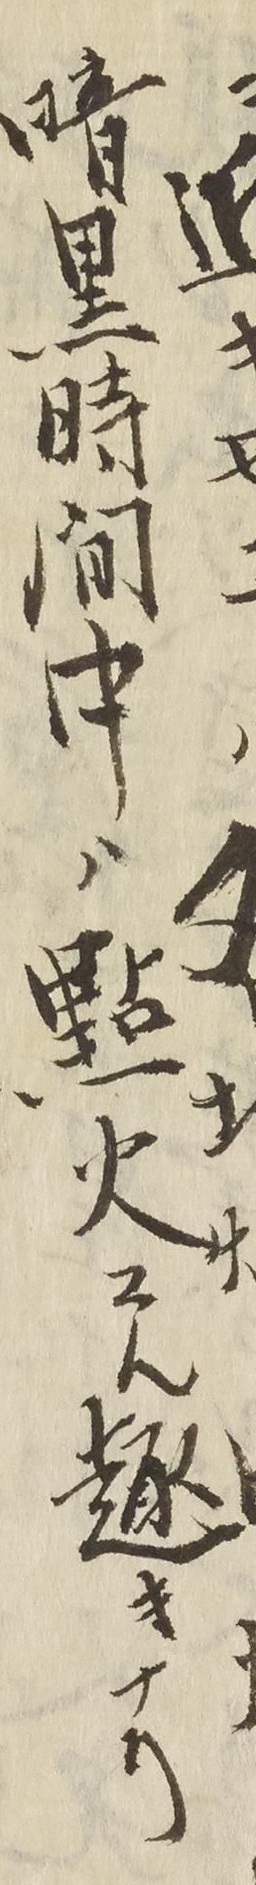暗黒時間中ハ点火スル趣キナリ
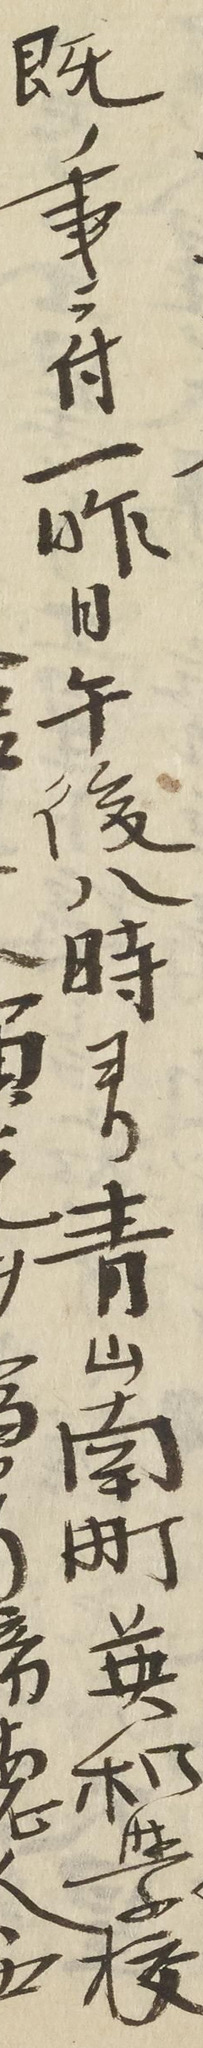既ノ事ニ付一昨日午後八時ヨリ青山南町英和学校
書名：日蝕録　全
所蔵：東京大学地震研究所図書室 Earthquake Research Institute Library, The University of Tokyo, JAPAN
